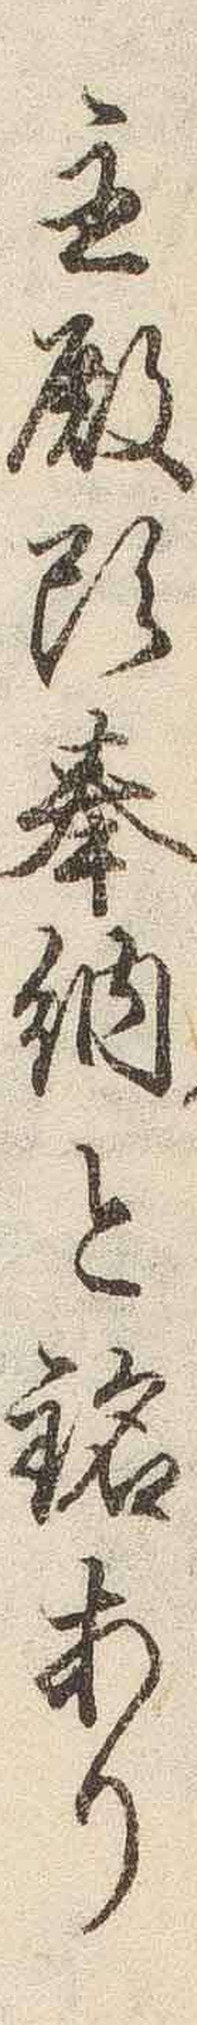主殿頭奉納と銘あり
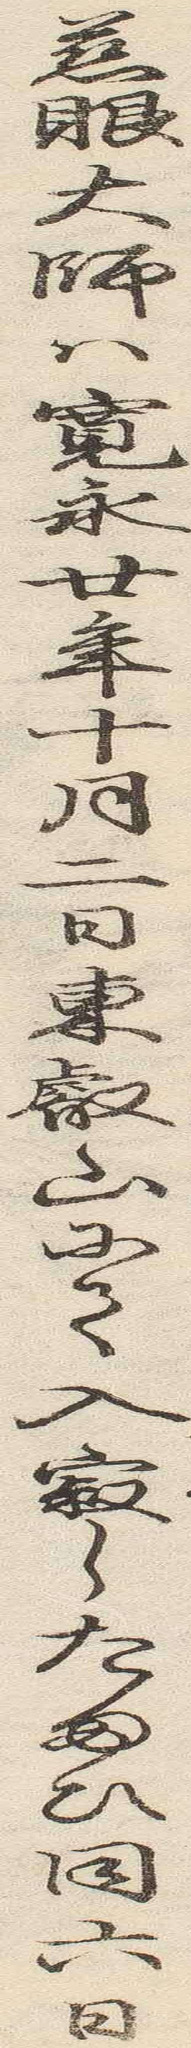慈眼大師は寛永廿年十月二日東叡山にて入寂したまひ同六日
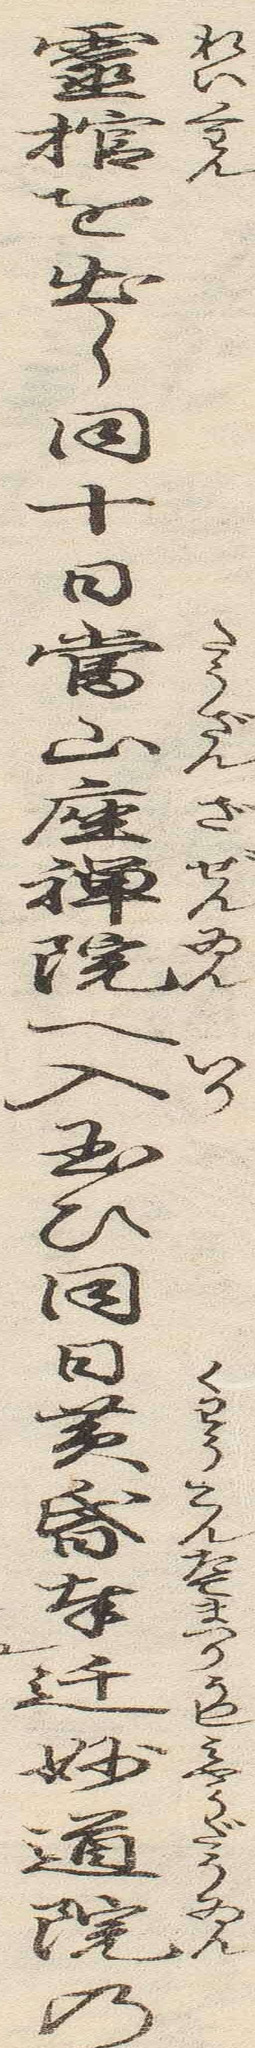靈棺を出し同十日當山座禅院へ入玉ひ同日黄昏奉迁妙道院の
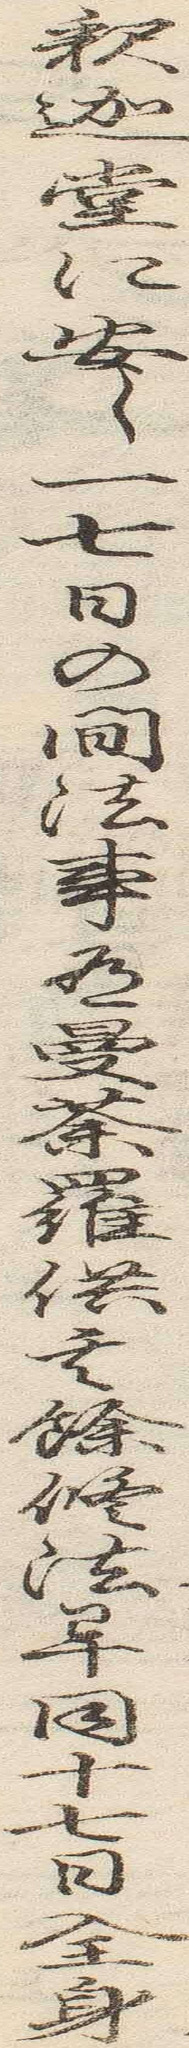釈迦堂に安し一七日の間法事有曼荼羅供其餘修法畢同十七日全身
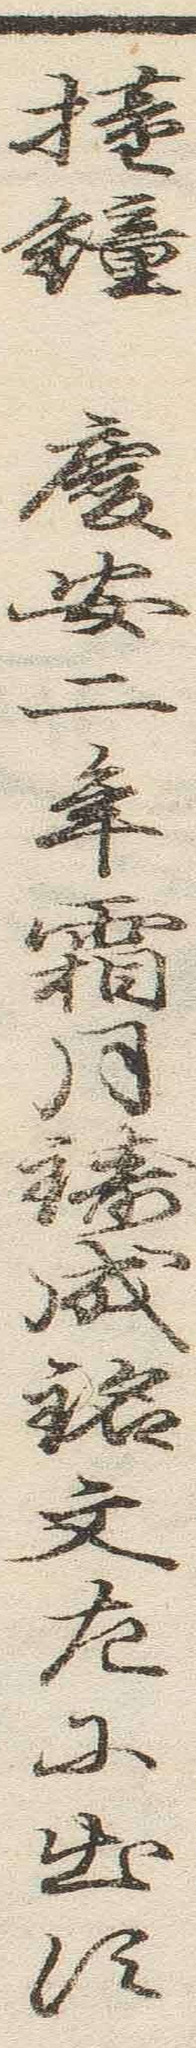撞鐘慶安二年霜月鋳成銘文左に出す
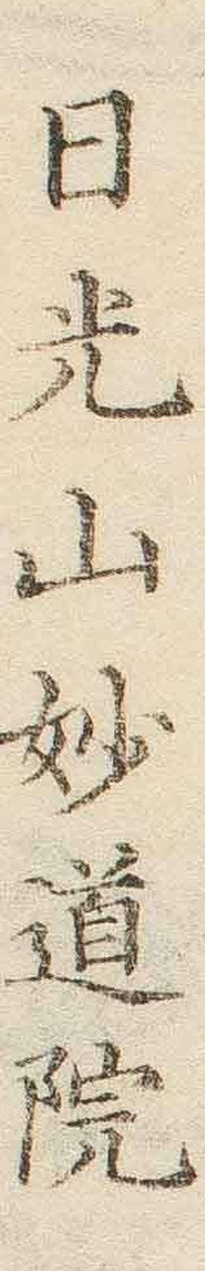日光山妙道院
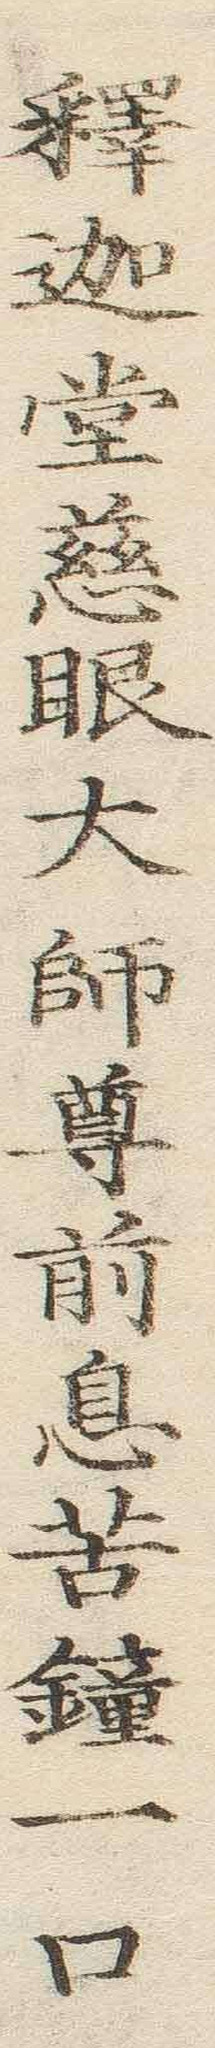釋迦堂慈眼大師尊前息苦鐘一口
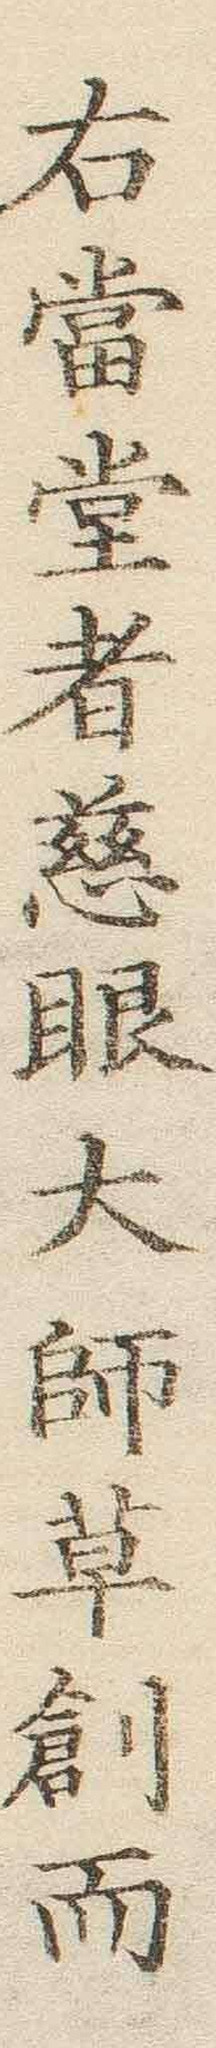右當堂者慈眼大師草創而
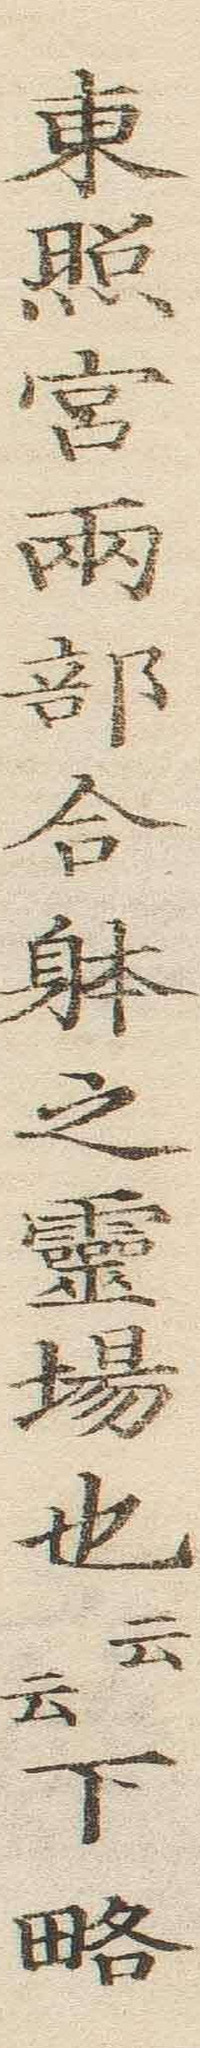東照宮兩部合躰之靈場也云云下略
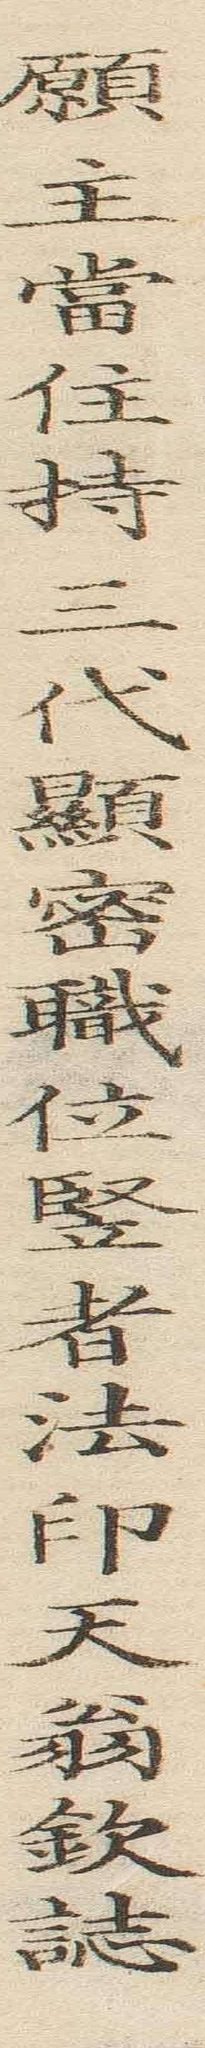願主當住持三代顯密職位竪者法印天翁欽誌
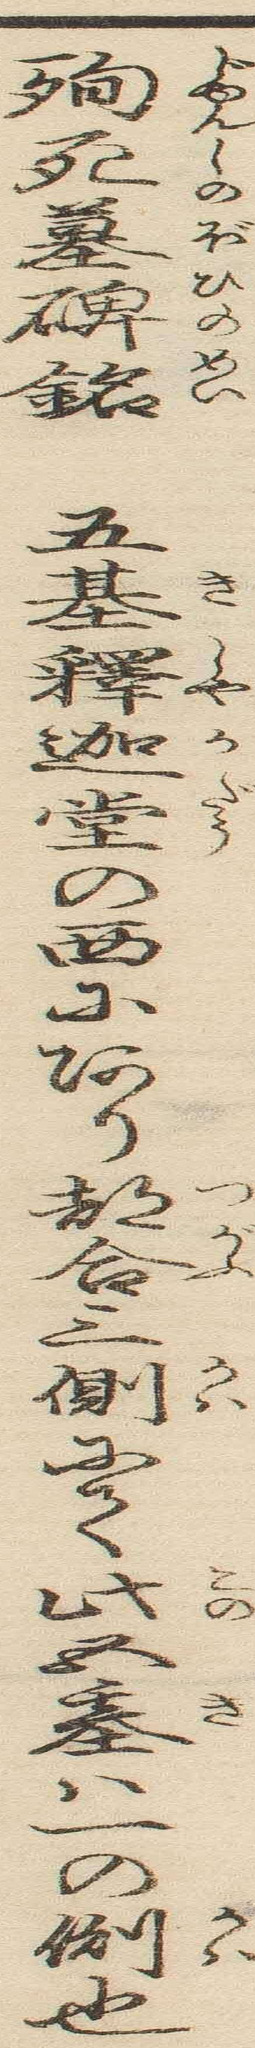殉死墓碑銘五基釋迦堂の西にあり都合三側にて此五基は一の側也

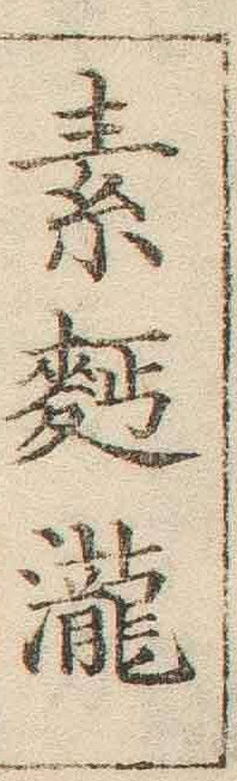素麪瀧

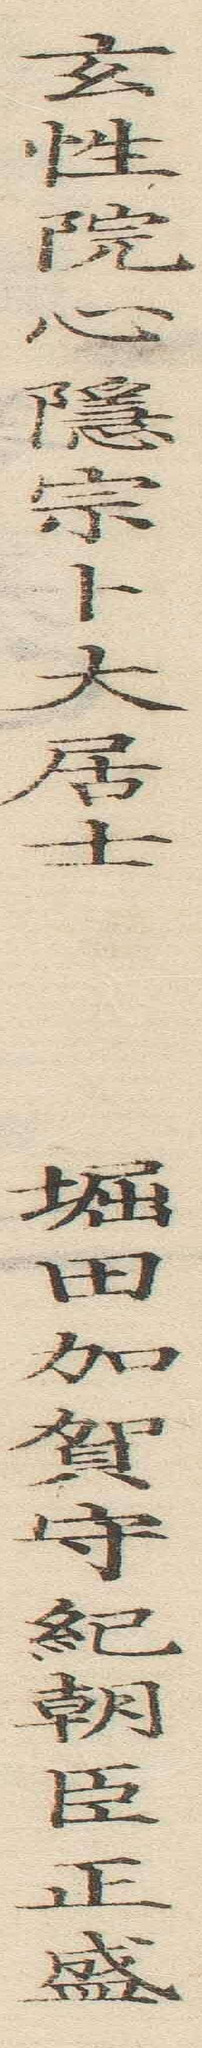玄性院心隱宗卜大居士堀田加賀守朝臣正盛
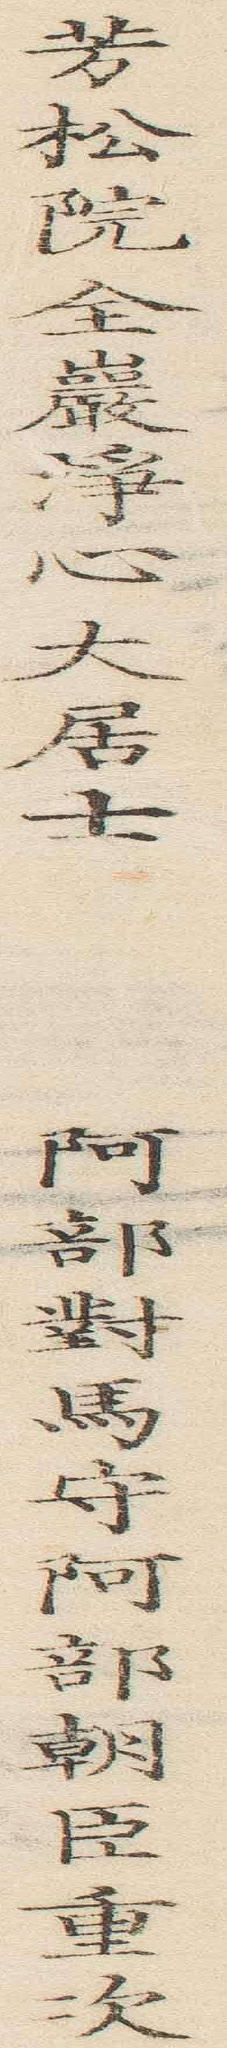芳松院全巖淨心大居士阿部對馬守阿部朝臣重次
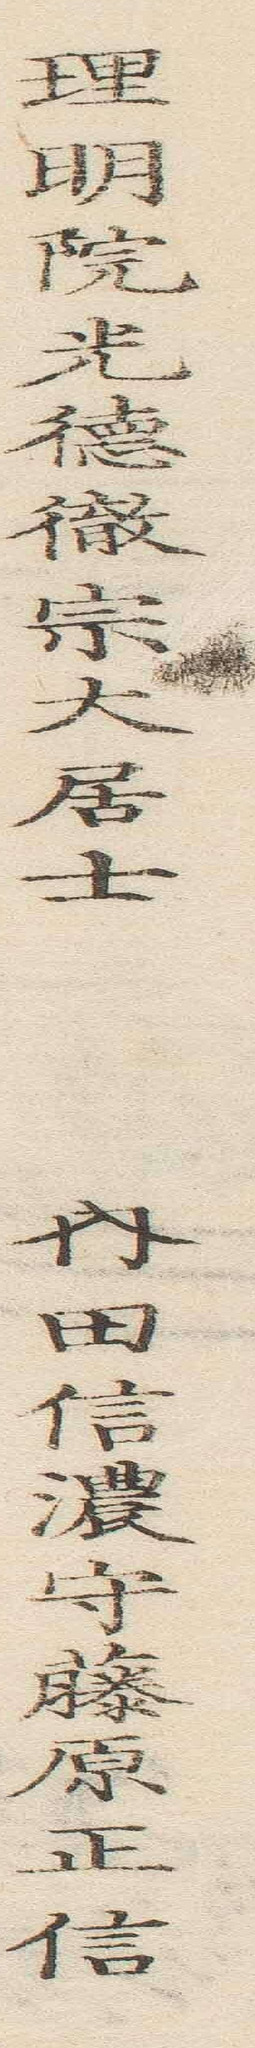理明院光德徹宗大居士内田信濃守藤原正信
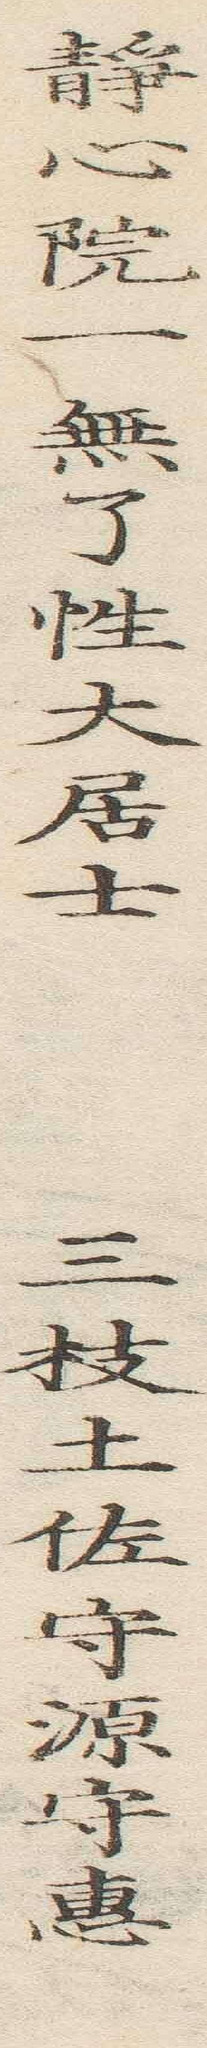靜心院一無了性大居士三枝土佐守源守惠
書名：日光山志
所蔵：東京学芸大学附属図書館 国文学研究資料館
